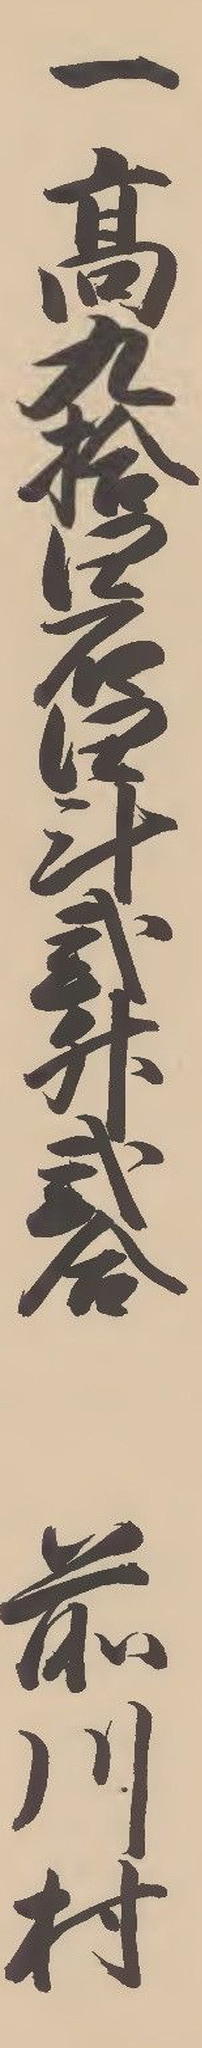一高九拾四石四斗弐升弐合前川村
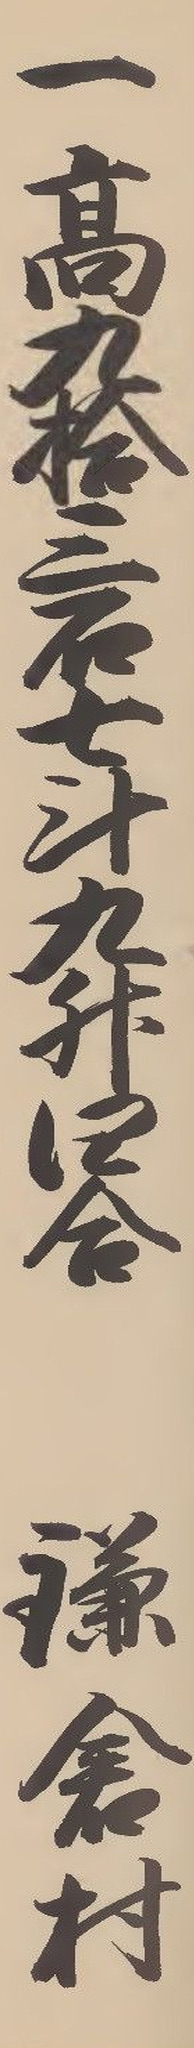一高九拾三石七斗九升四合鎌倉村
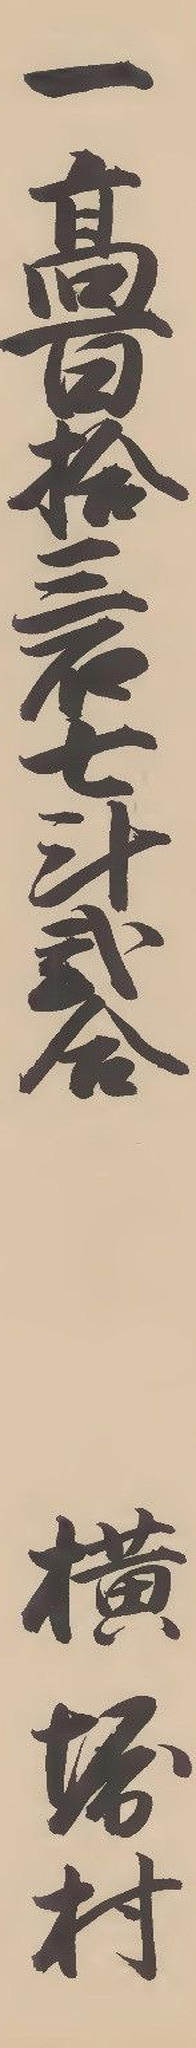一高百拾三石七斗弐合横堀村
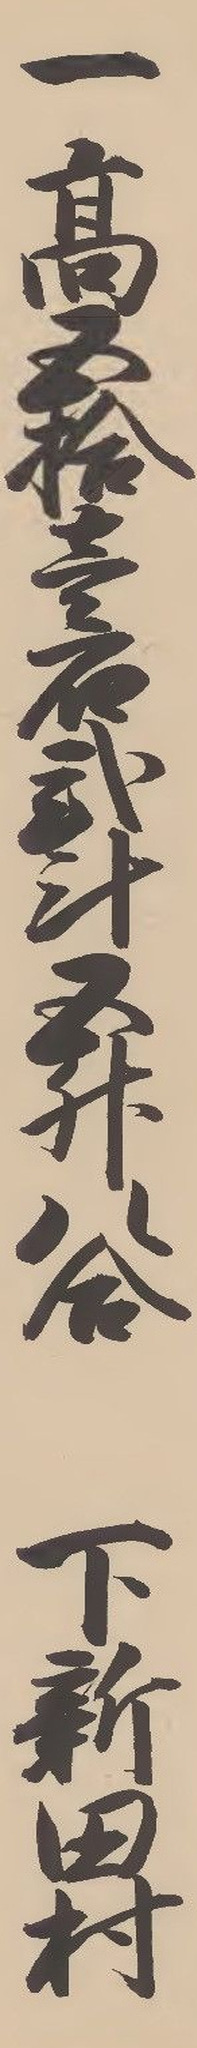一高五拾壱石弐斗五升八合下新田村
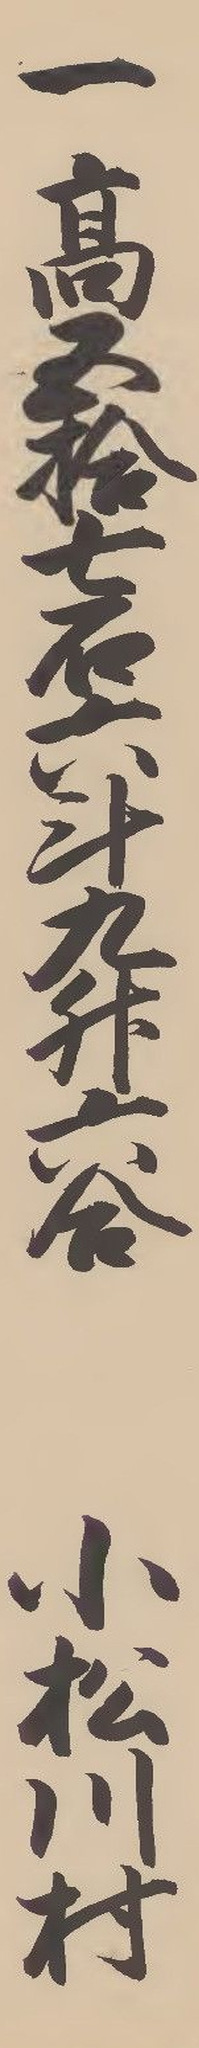一高五拾七石六斗九升六合小松川村

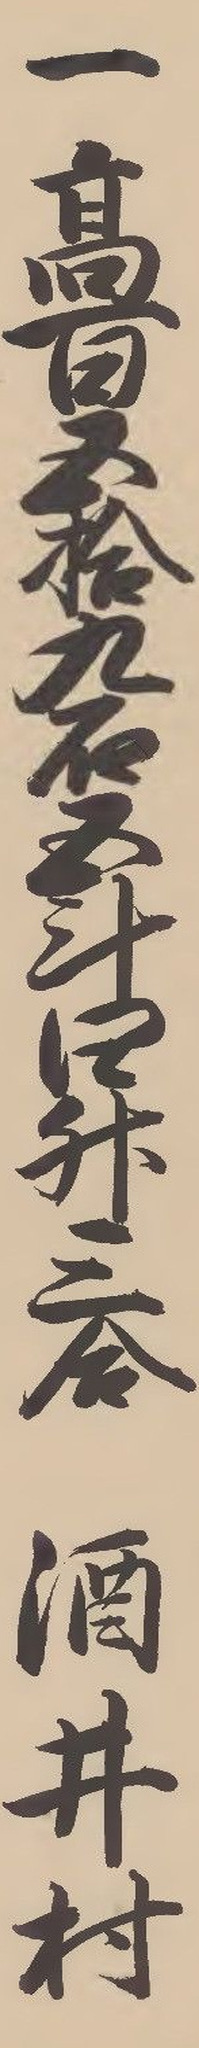一高百五拾九石五斗四升三合酒井村
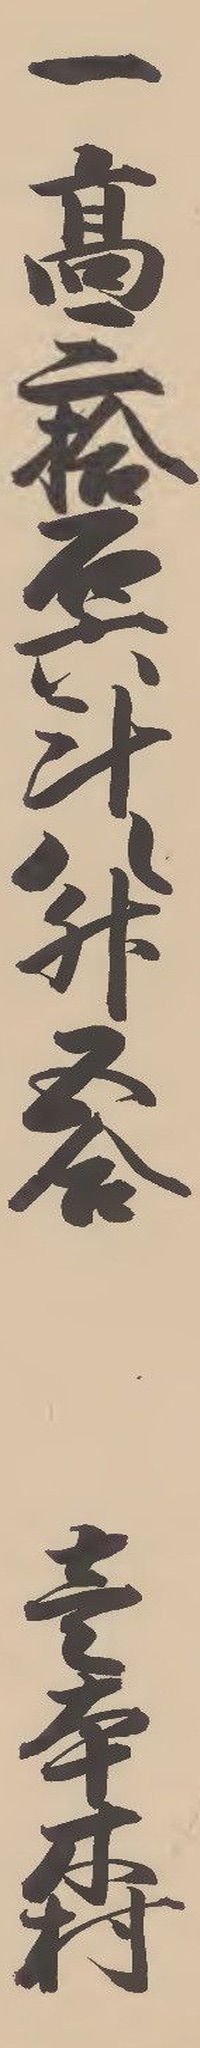一高三拾石六斗八升五合壱本木村
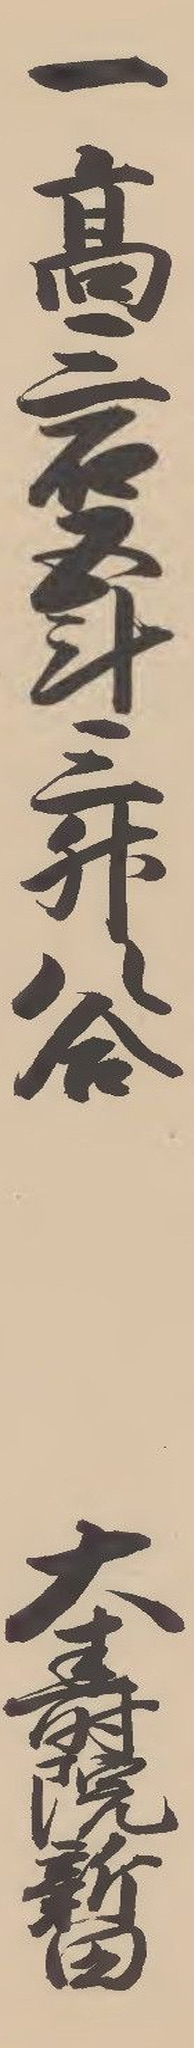一高三石五斗三升合大寿院新田
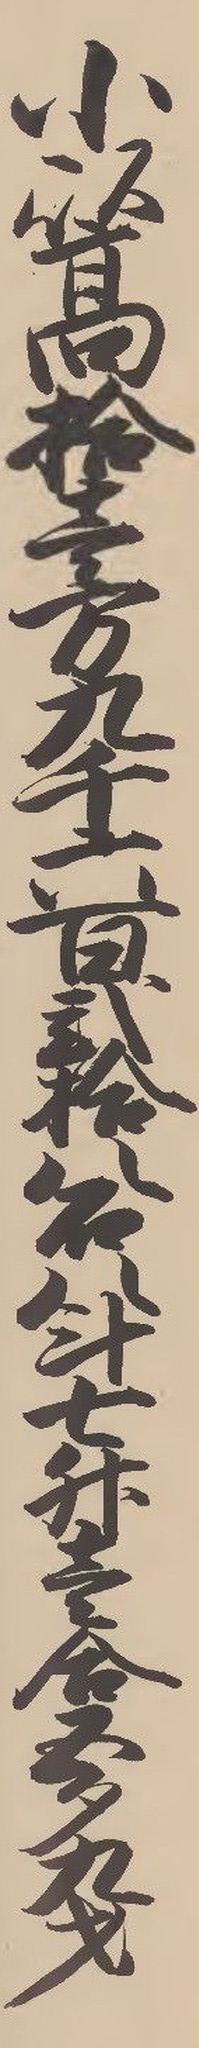小以高拾壱万九千六百弐拾八石七升壱合五勺九才
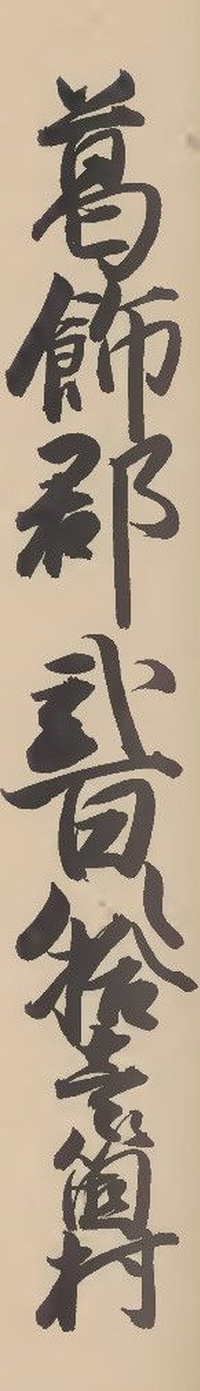葛飾郡弐百八拾壱筒村

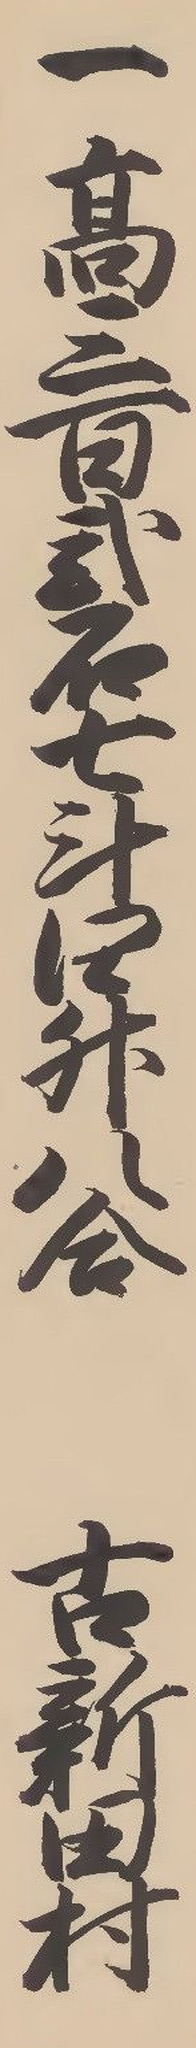一高三百弐石七斗四升八合古新田村
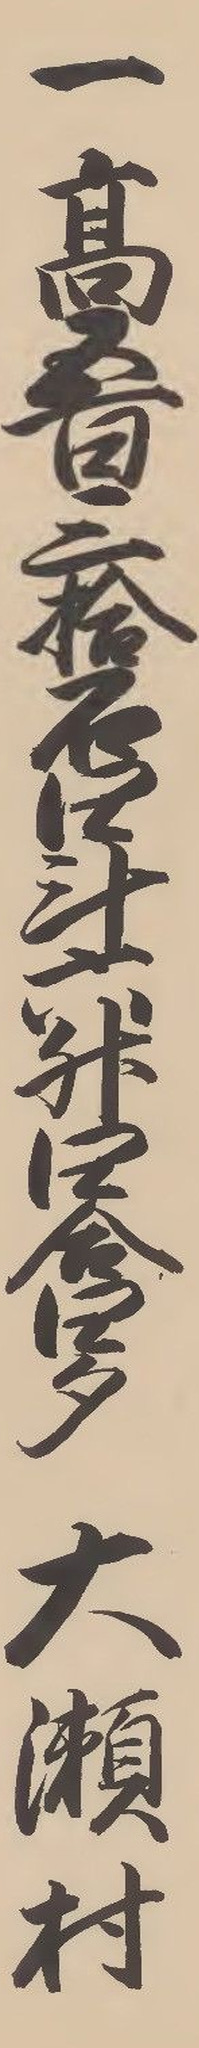一高五百三拾三石四斗一升四合四勺大瀬村
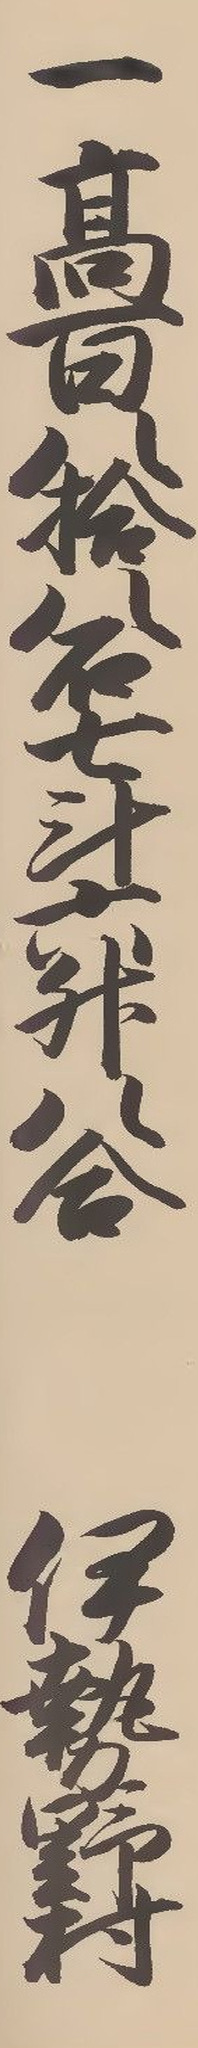一高百八拾八石七斗六升八合伊勢野村
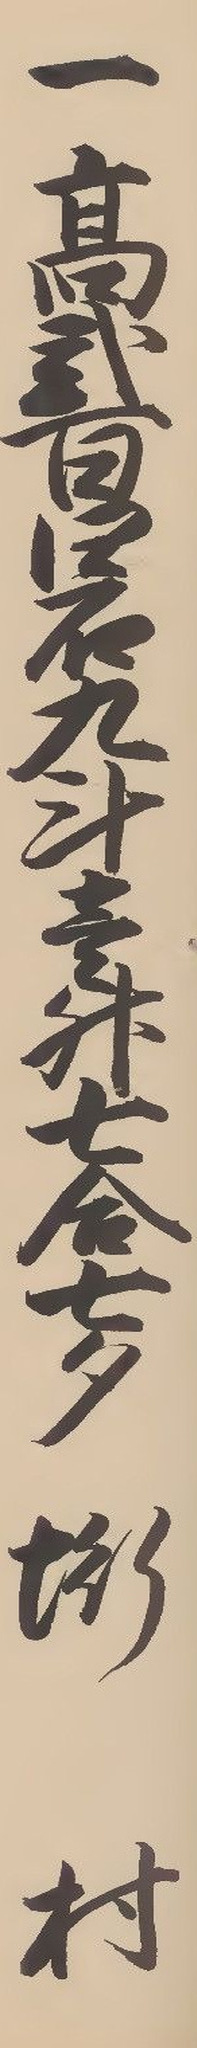一高弐百四石九斗壱升七合七勺垳村
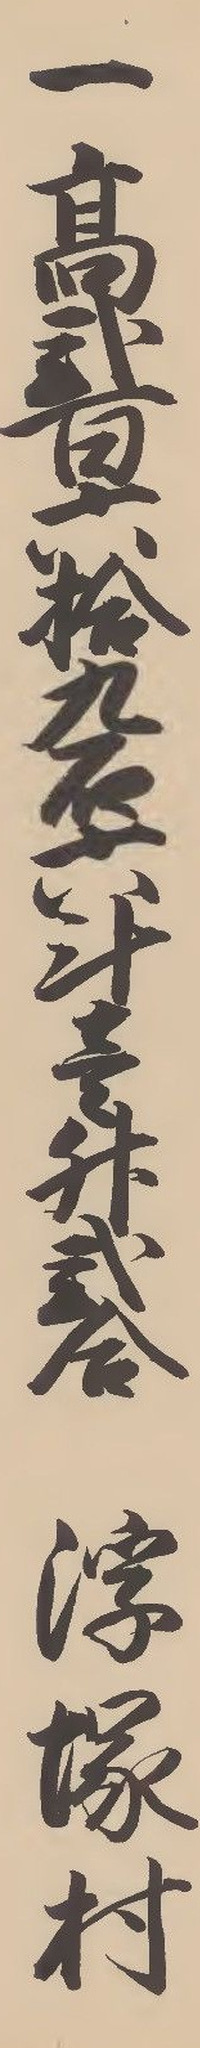一高弐百六拾九石六斗壱升弐合浮塚村
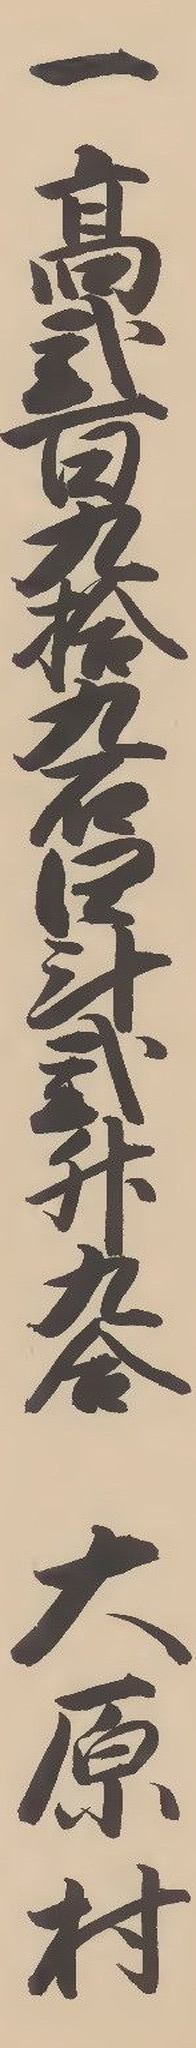一高弐百九拾九石四斗弐升九合大原村
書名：武蔵国郷帳　下
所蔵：国立公文書館 National Archives of Japan
